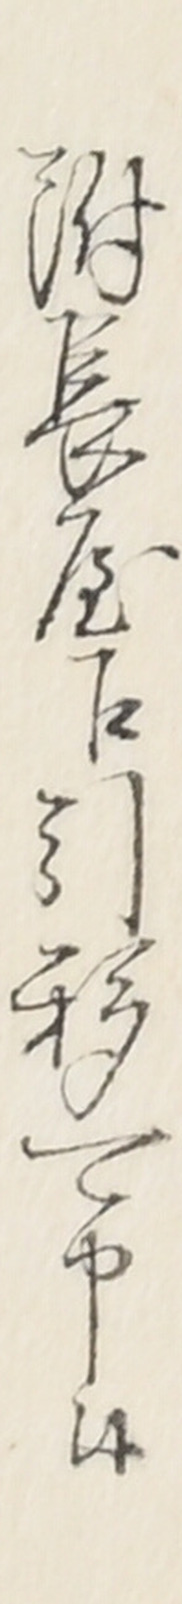附長屋江引移可申候
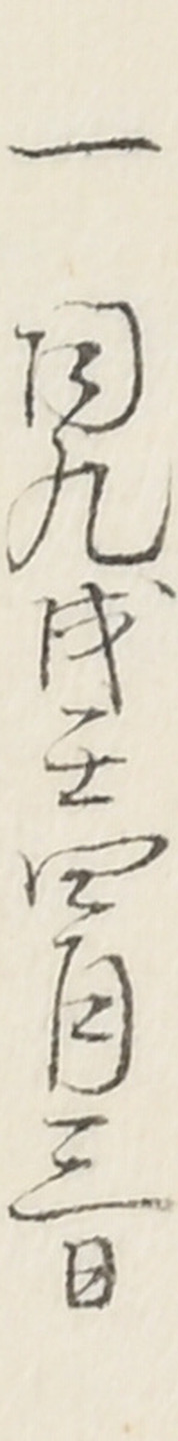一同九戌閏四月三日
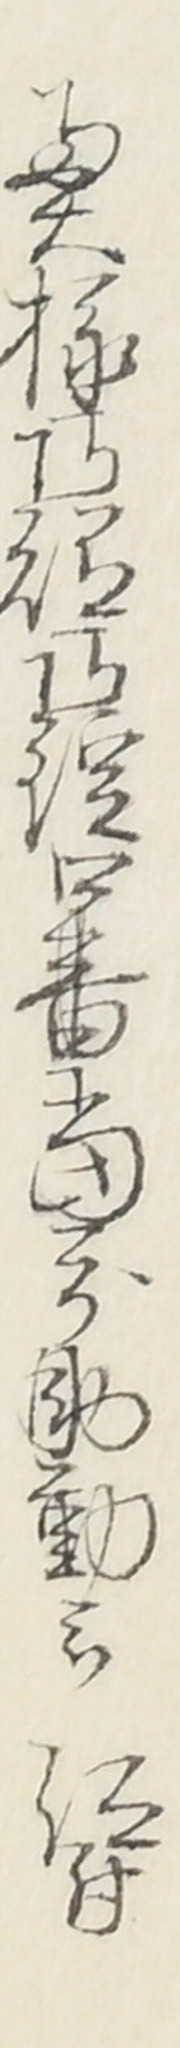奥様御賄御錠口番当分助勤被仰付
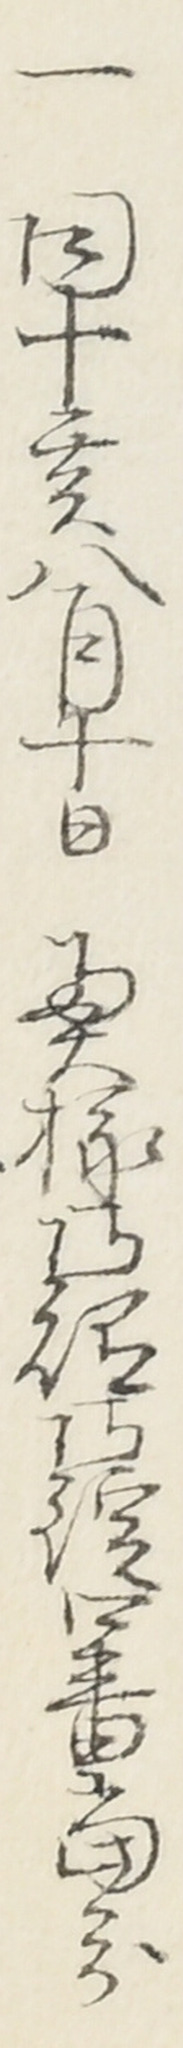一同十亥八月十日奥様御賄御錠口番当分
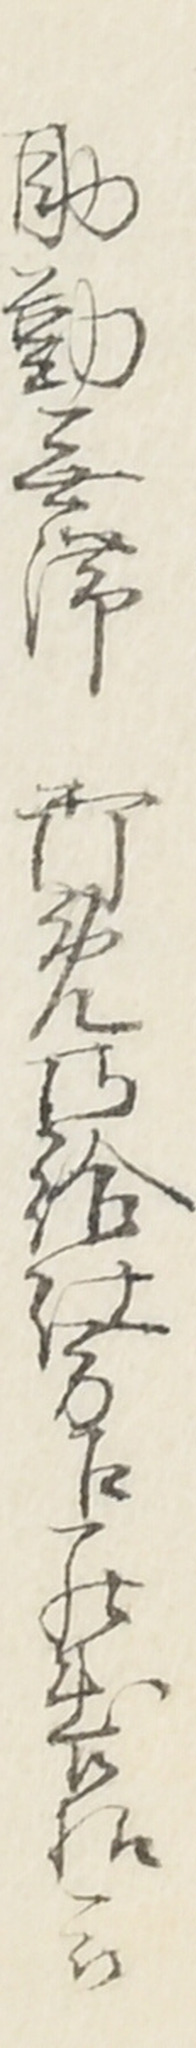助勤無滞御免御給仕方江罷出候様被
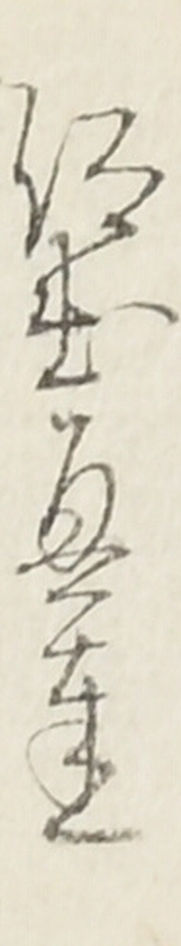仰出通達
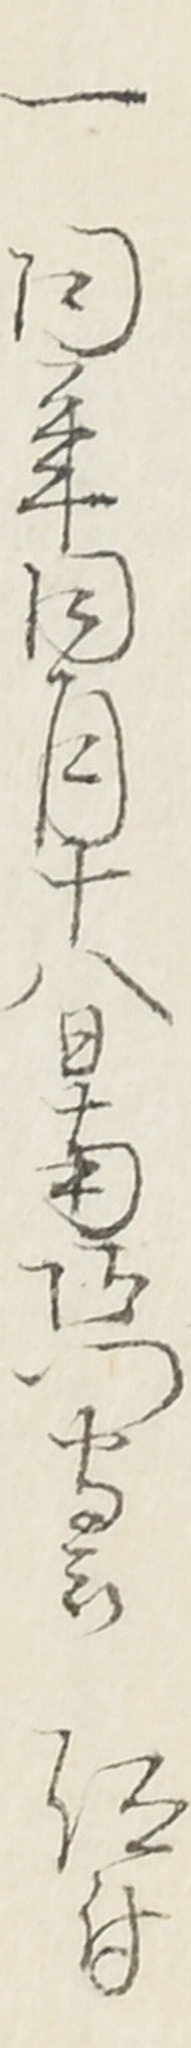一同年同月十八日南御門守被仰付
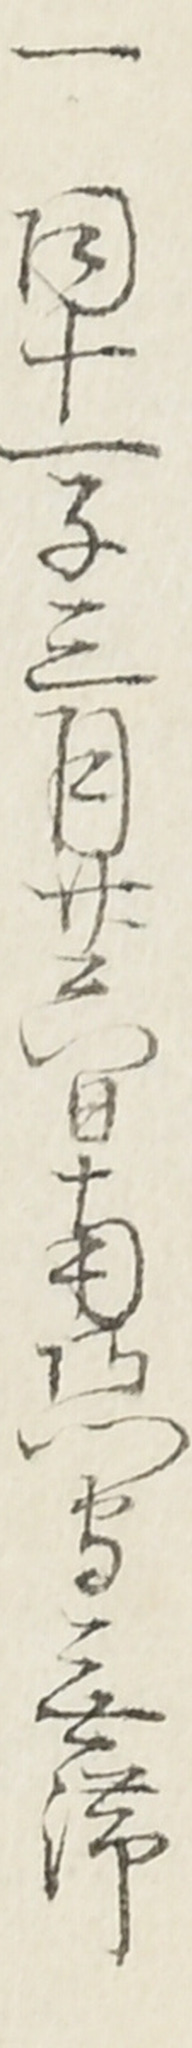一同十一子三月廿六日南御門守無滞
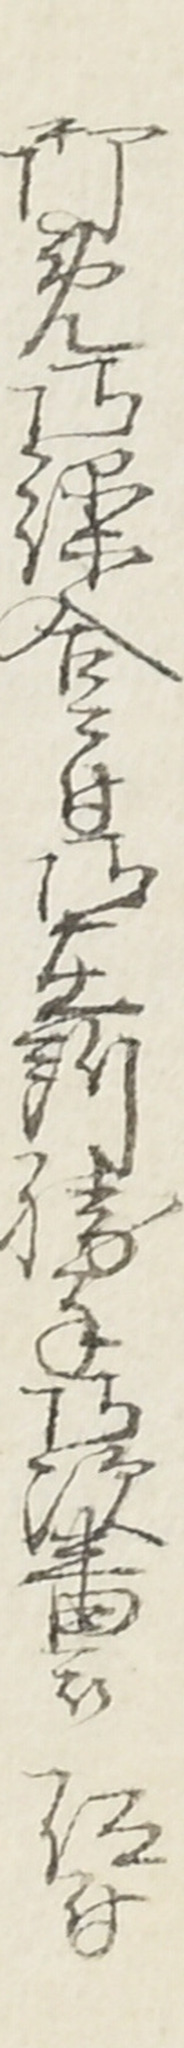御免御繰合ニ付御在所勝手御次番被仰付
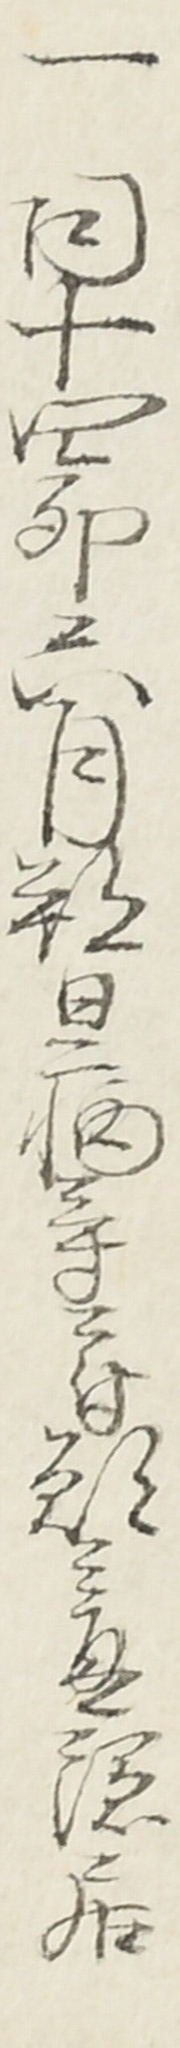一同十四卯六月朔日病気ニ付願之通隠居
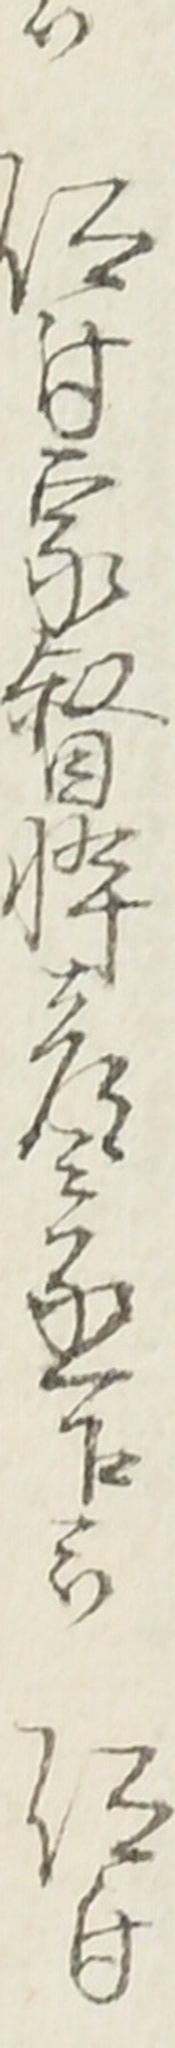被仰付家督忰彦之丞江被仰付
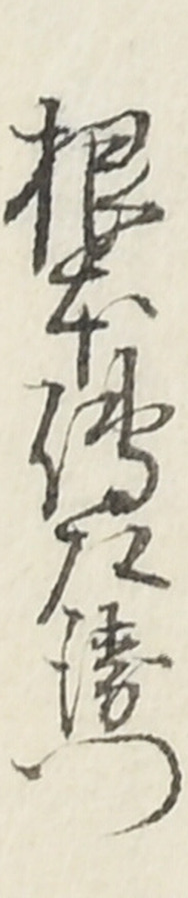根本伝左衛門

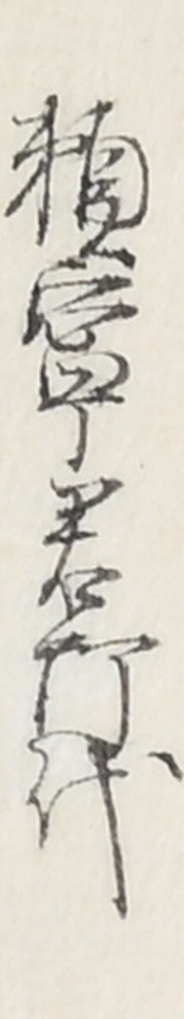頼寧君御代
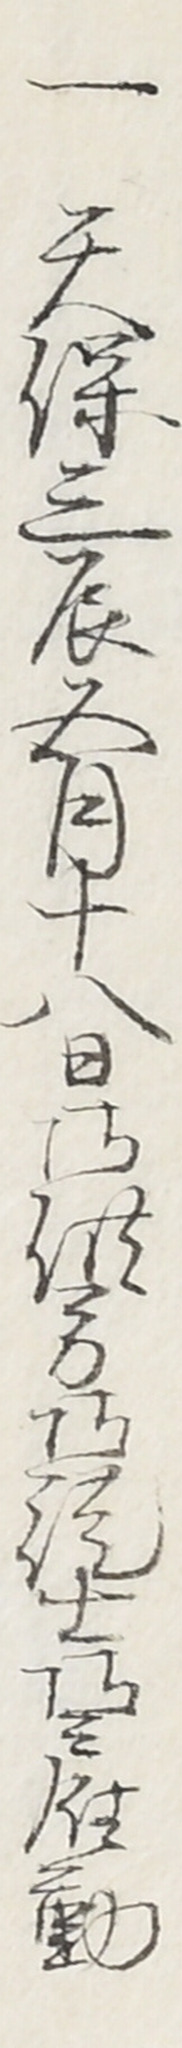一天保三辰五月十八日御供方御徒士御雇勤
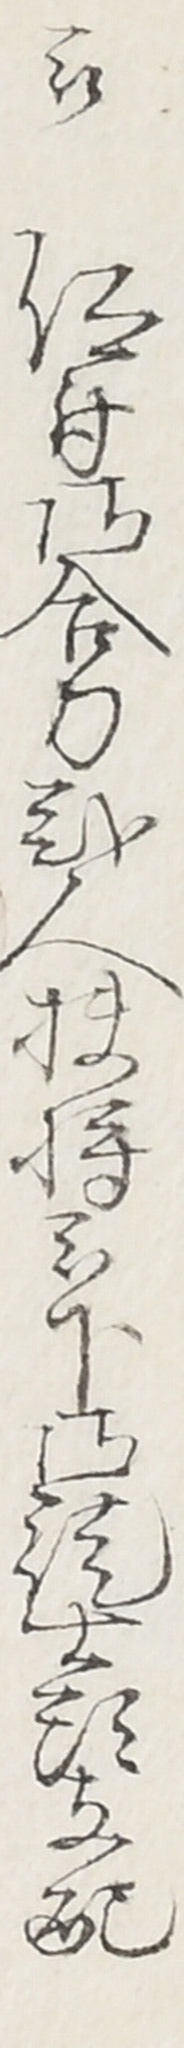被仰付御合力弐人扶持被下御徒士頭支配
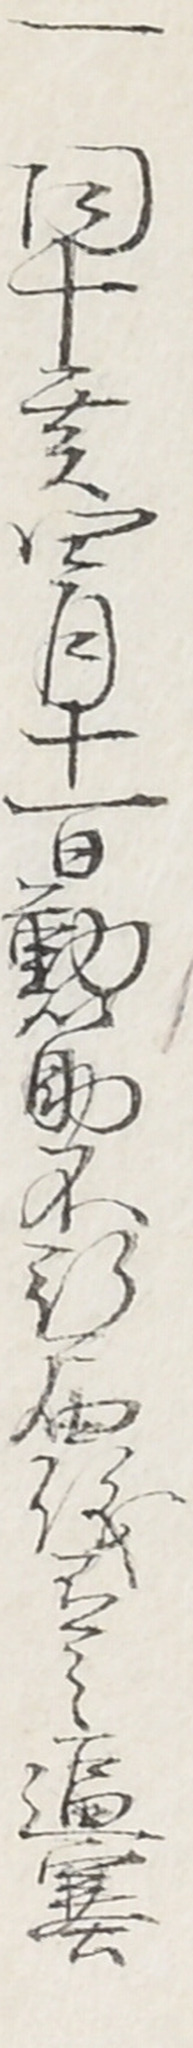一同十亥四月十一日勤筋不行届儀有之逼塞
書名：無足諸士勤仕録（四）
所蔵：伊那市立高遠町図書館・合同会社AMANE
